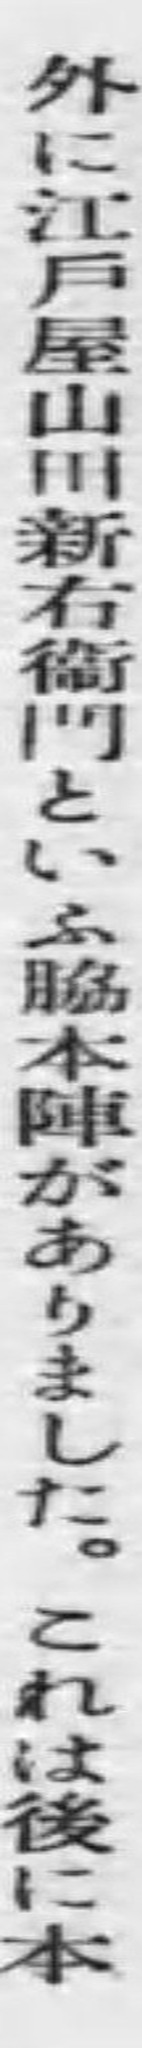外に江戸屋山田新右衛門という脇本陣がありました。これは後に本
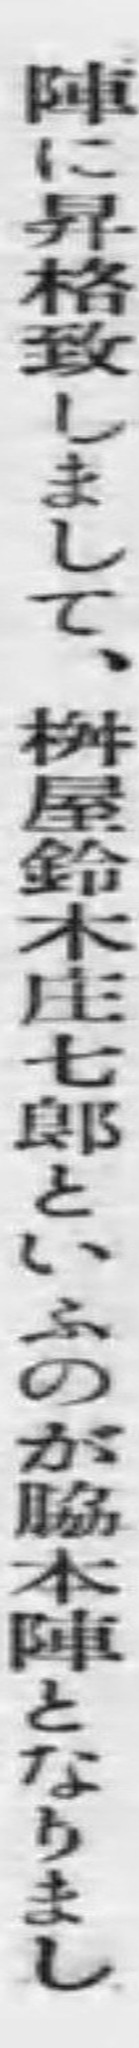陣に昇格致しまして、桝屋鈴木庄七郎といふのが脇本陣となりまし
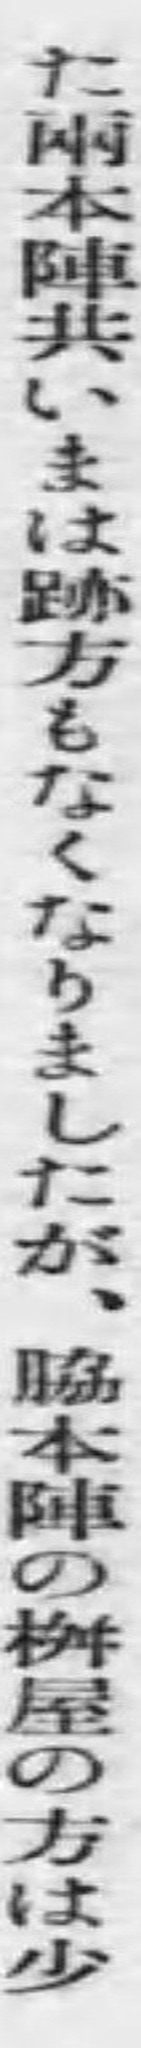た両本陣共いまは跡方もなくなりましたが、脇本陣の桝屋の方は少
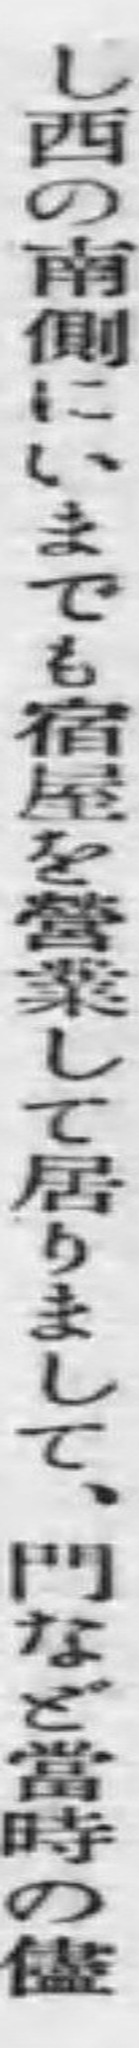し西の南側にいまでも宿屋を営業して居りまして、門など当時の儘
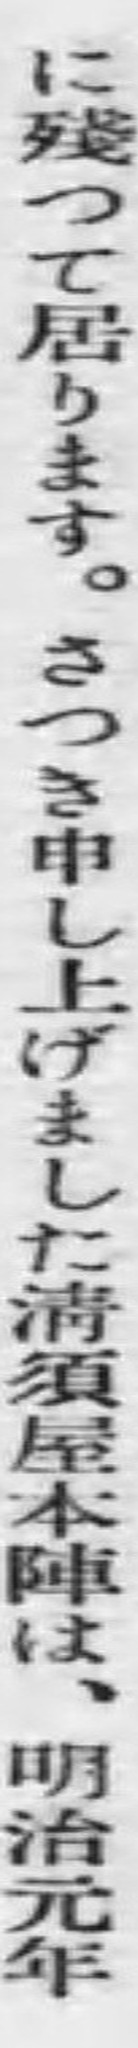に残つて居ります。さつき申し上げました清須屋本陣は、明治元年
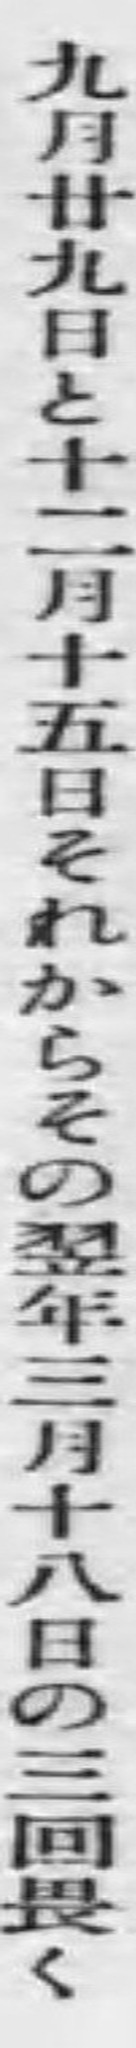九月廿九日と十二月十五日それからその翌年三月十八日の三回畏く
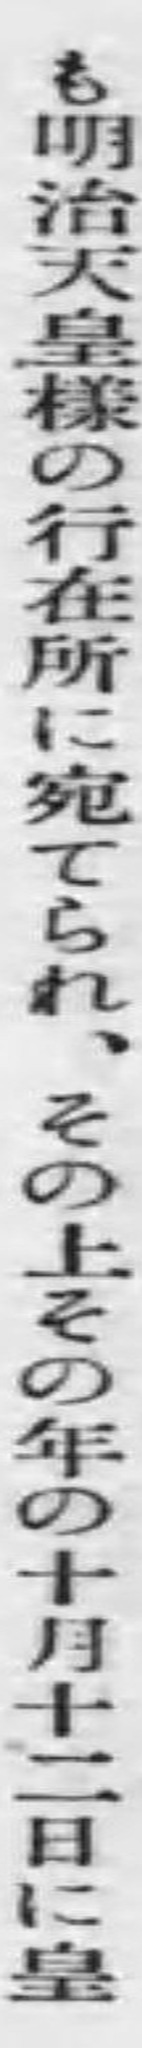も明治天皇様の行在所に宛てられ、その上その年の十月十二日に皇
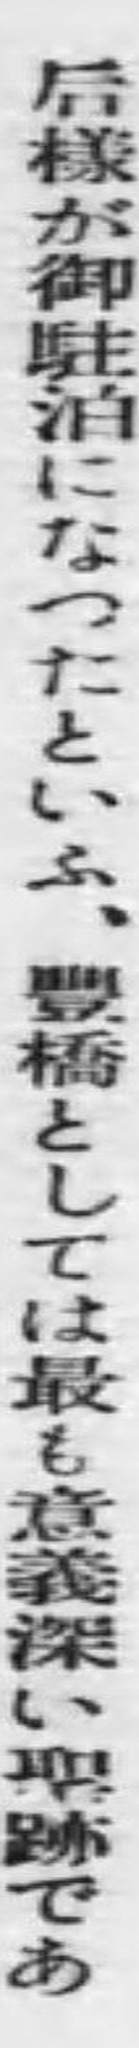后様が御駐泊になつたといふ、豊橋としては最も意義深い聖跡であ
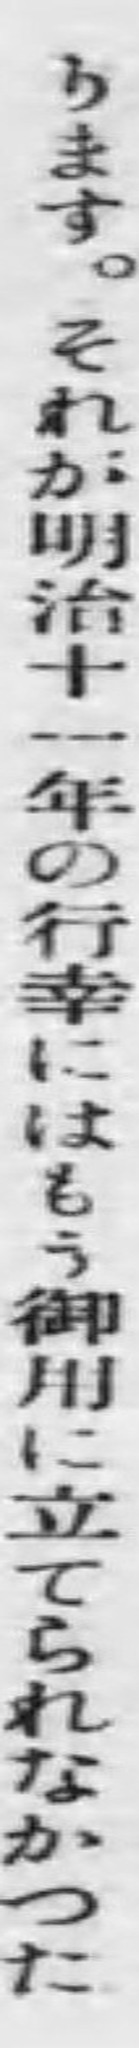ります。それが明治十一年の行幸にはもう御用に立てられなかつた
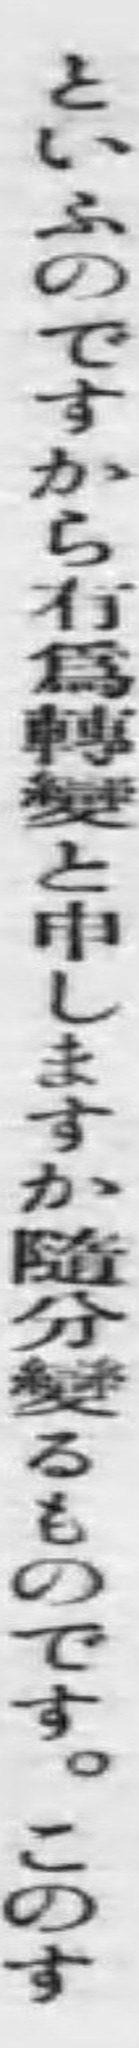といふのですから有為転変と申しますか随分変るものです。このす
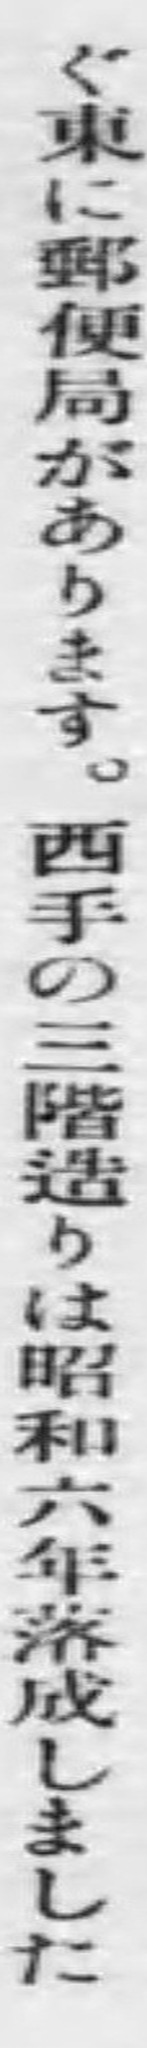ぐ東に郵便局があります。西手の三階造りは昭和六年落成しました
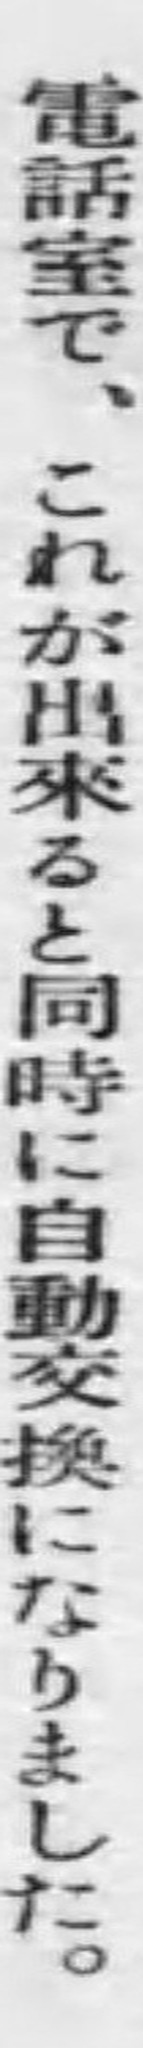電話室で、これが出来ると同時に自動交換になりました。
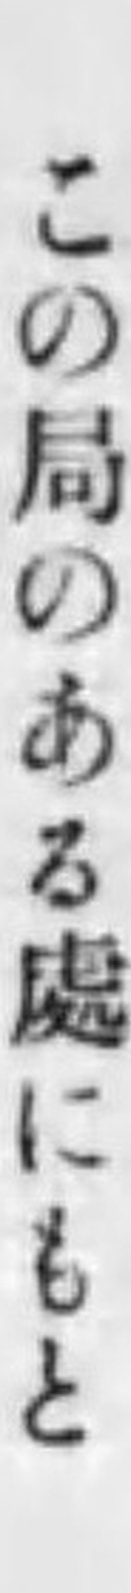この局のある処にもと
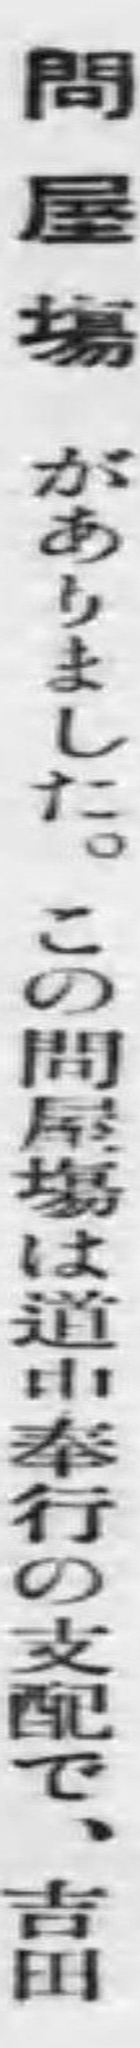問屋場がありました。この問屋場は道中奉行の支配で、吉田
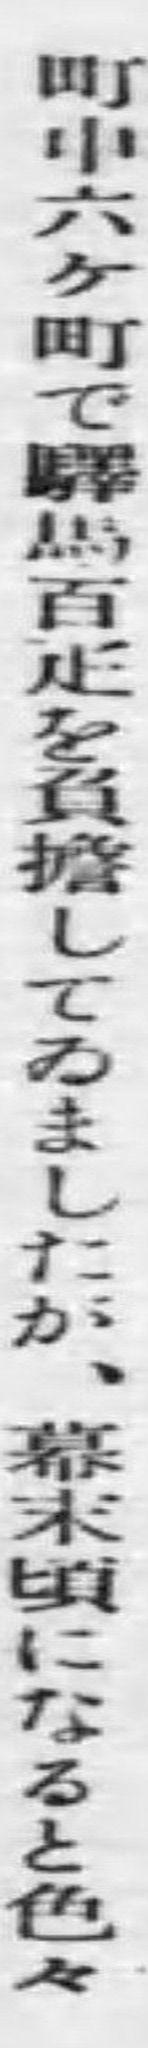町中六ヶ町で駅馬百疋を負担してゐましたが、幕末頃になると色々
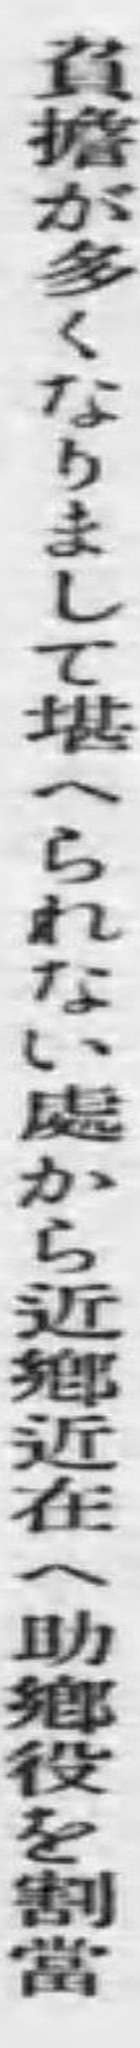負担が多くなりまして堪へられない処から近郷近在へ助郷役を割当
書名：東三河道中記 : 豊橋市及其附近案内
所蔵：国立国会図書館 National Diet Library, JAPAN
